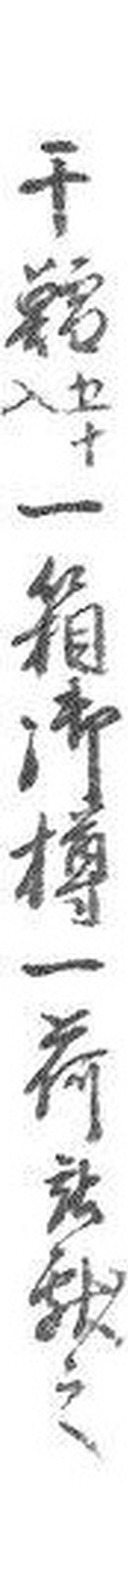干鱈五十入一箱御樽一荷被献之
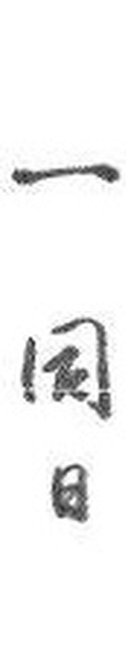一同日
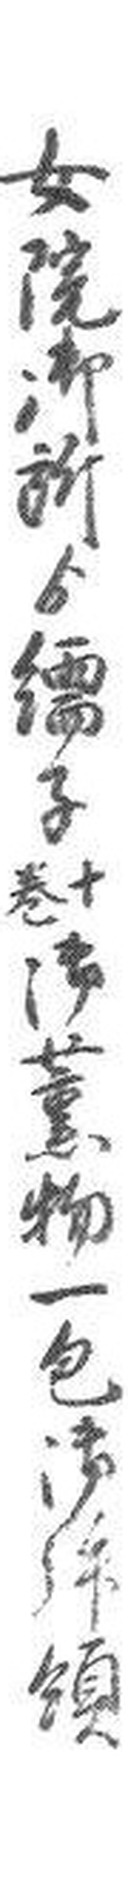女院御所ゟ繻子十巻御薫物一包御拝領
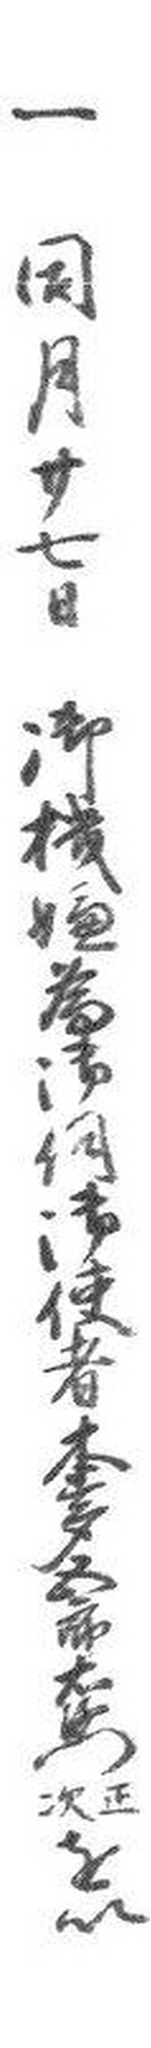一同月廿七日御機嫌為御伺御使者本多五郎右衛門正次を以
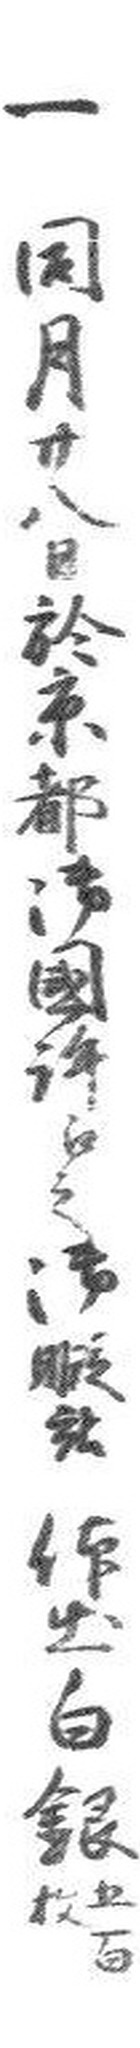一同月廿八日於京都御国許江之御暇被仰出白銀五百枚
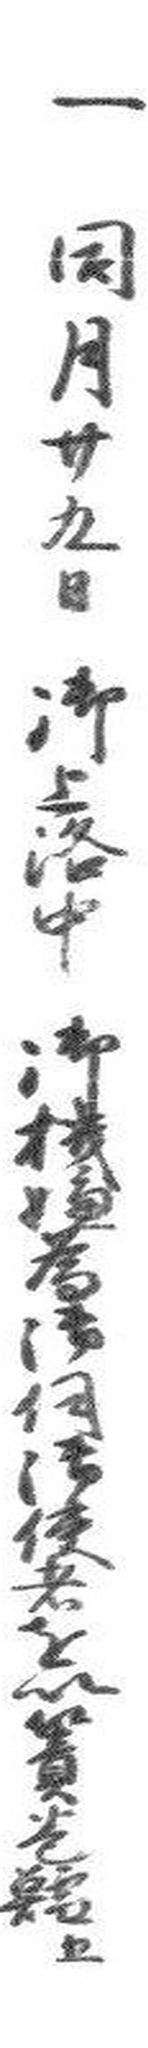一同月廿九日御上洛中御機嫌為御伺御使者を以簀巻鱈五
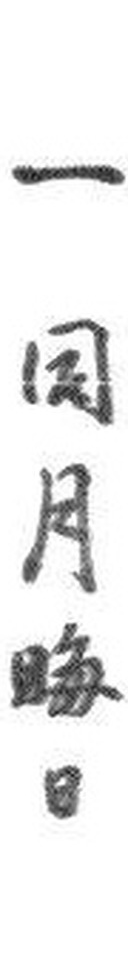一同月晦日
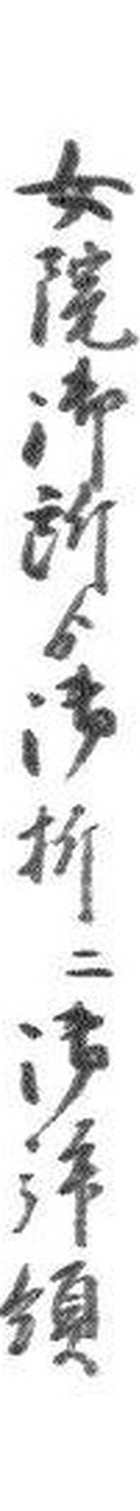女院御所ゟ御折二御拝領
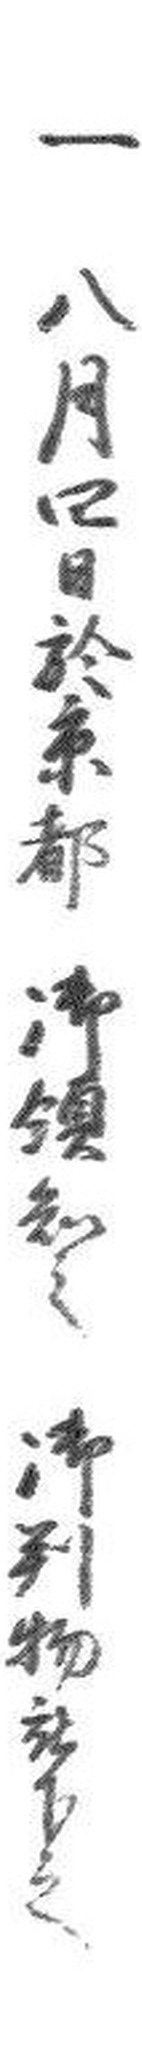一八月四日於京都御領知之御判物被下之
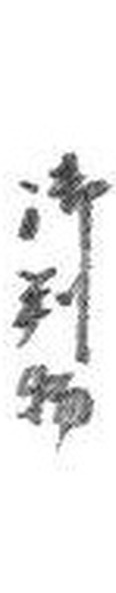御判物
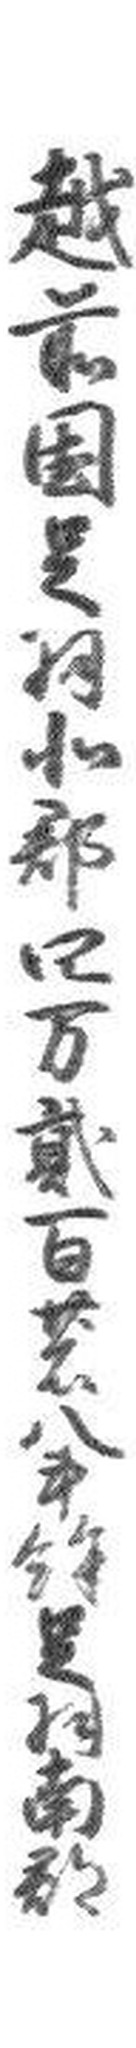越前国足羽北郡四万弐百廿石八斗余足羽南郡
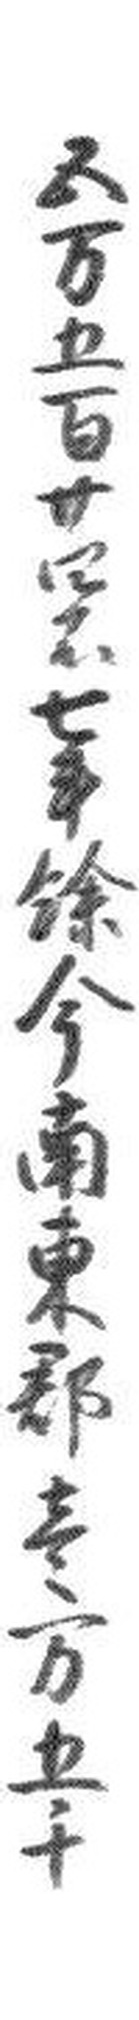五万五百廿四石七斗余今南東郡壱万五千

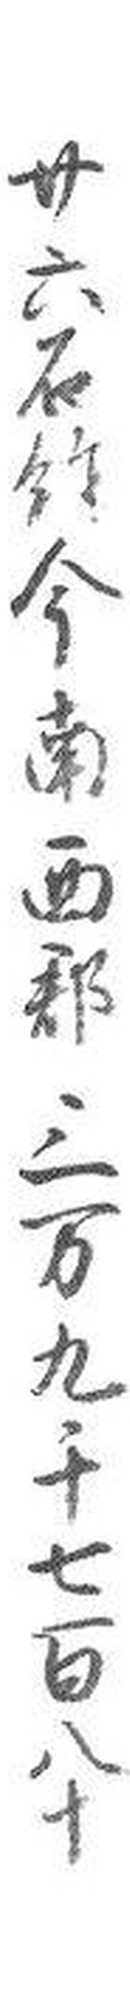廿六石余今南西郡三万九千七百八十
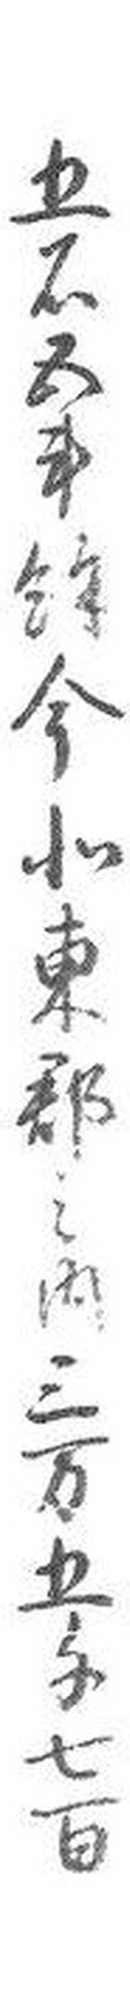五石五斗余今北東郡之内三万五千七百
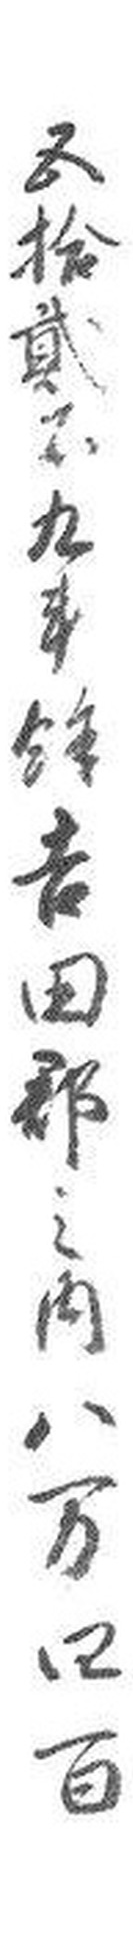五拾弐石九斗余吉田郡之内八万四百
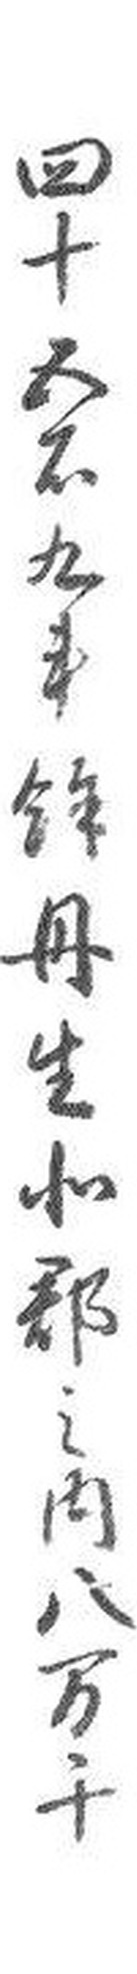四十五石九斗余丹生北郡之内八万千
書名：家譜 四 忠昌公 従寛永七年到正保四年
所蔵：福井県文書館 Fukui Prefectural Archives
